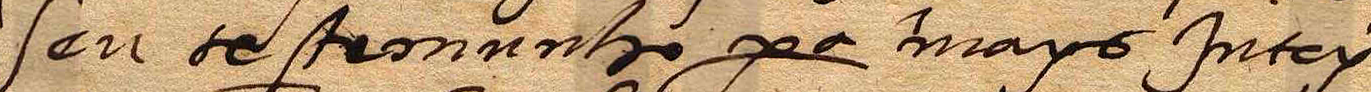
seu testemunho ꝑa mays Jntey
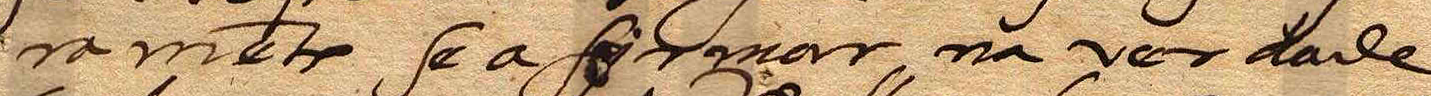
ramēte se afyrmar na verdade
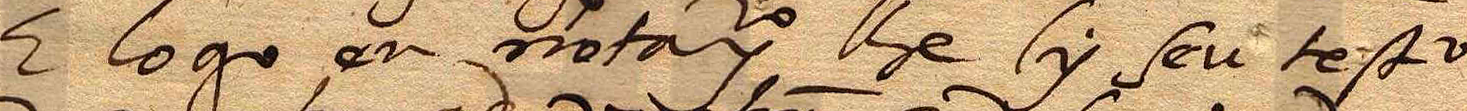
E logo eu notayro lhe ly seu testo
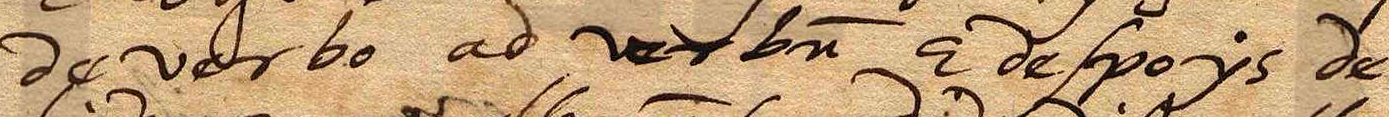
de verbo ad verbū E depoys de
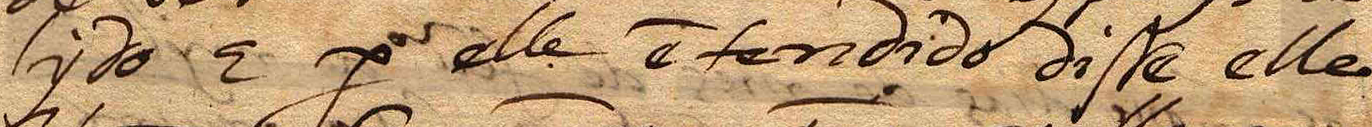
lydo E ꝑ elle ētendido disse elle
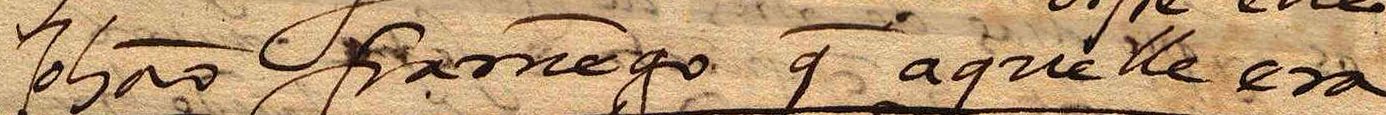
Johão framēgo q̄ aquelle era
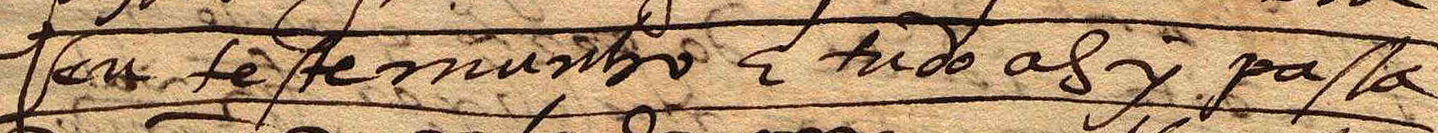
seu testemunho E tudo asy passa
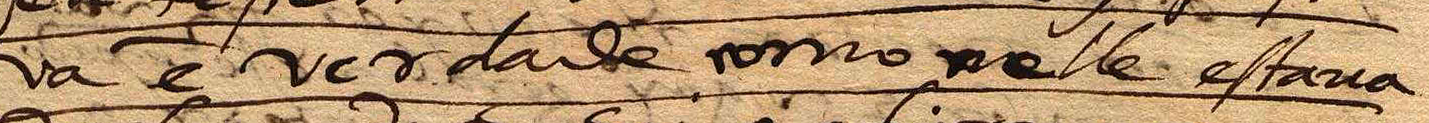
va ē verdade como nelle estaua
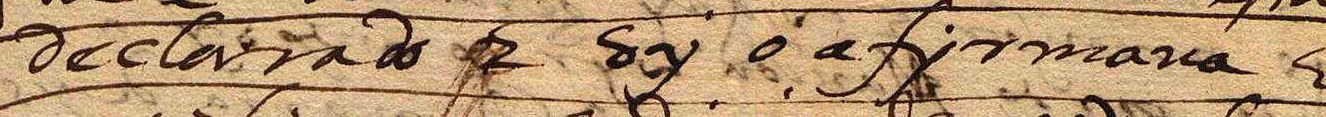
declarado E sy o afyrmaua E
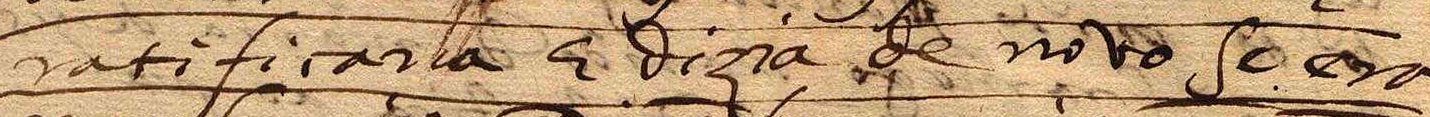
ratificaua E dizia de novo se era
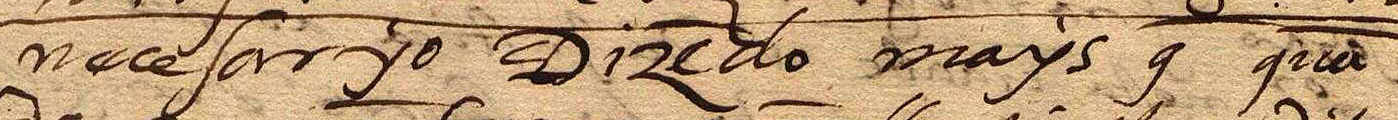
necesaryo Dizēdo mays q̄ quā
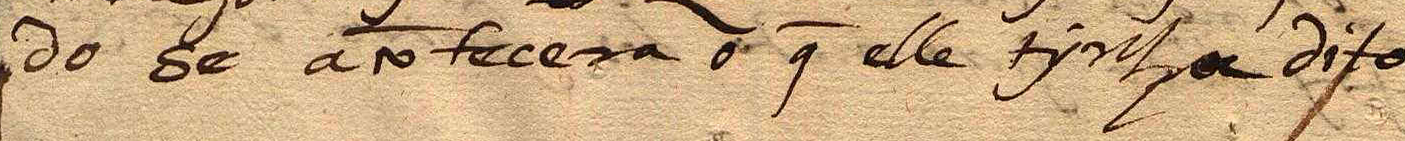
do se acōtecera o q̄ elle tynha dito
